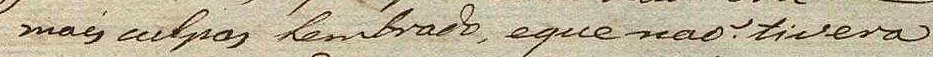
mais culpas Lembrado, e que naõ tivera
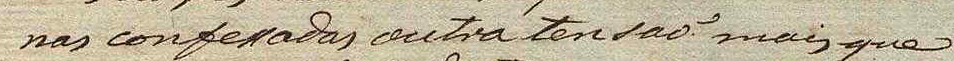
nas confessadas outra tensaõ mais que
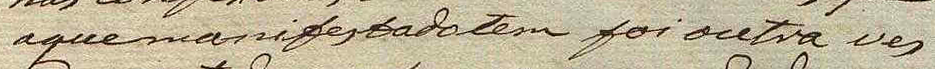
a que manifestado tem foi outra ves
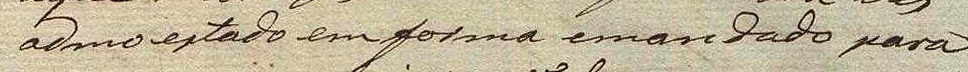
admoestado em forma e mandado para
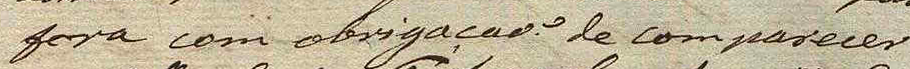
fora com obrigaçaõ de comparecer
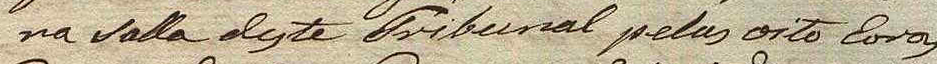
na salla deste Tribunal pelas oito horas
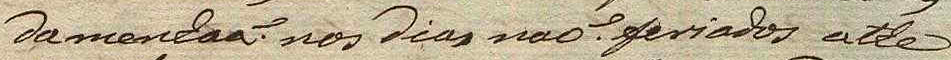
da menhaã nos dias naõ feriados athe
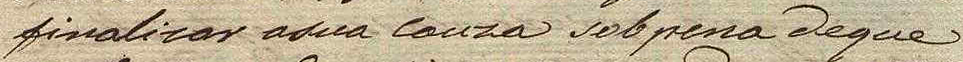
finalizar a sua cauza sob pena de que
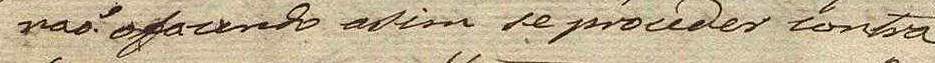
naõ o fazendo asim se proceder contra
